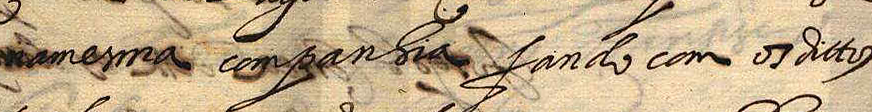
na mesma companhia fando com os dittos
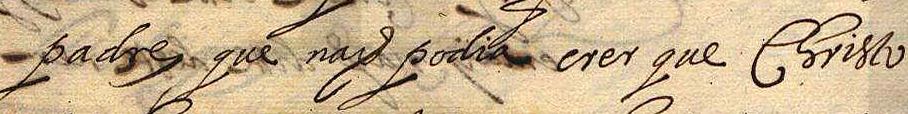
padres que naõ podia crer que Christo
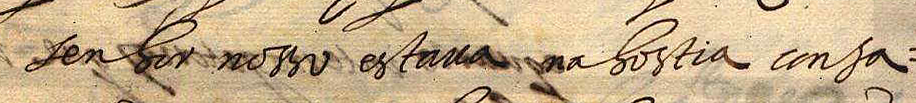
senhor nosso estaua na hostia consa
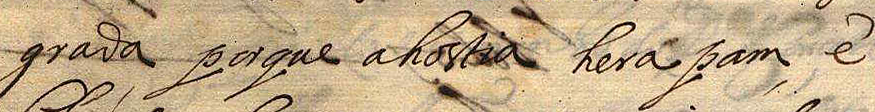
grada porque a hostia hera pam, e
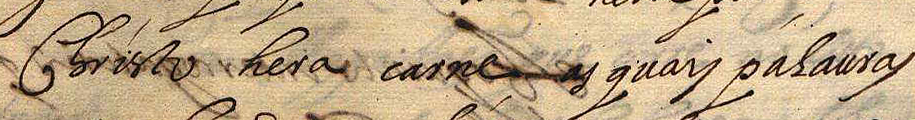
Christo hera carne, as quais palauras
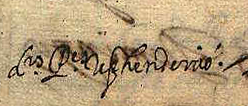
d.os P.es Rep̄henderaõ.
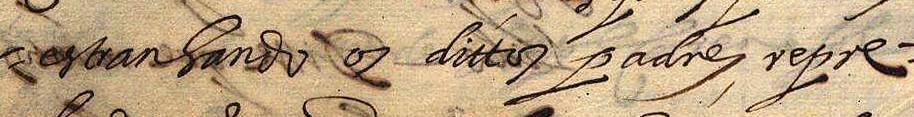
estranhando os dittos padres, repre
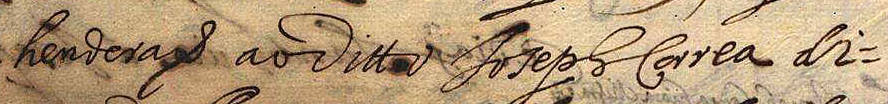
henderaõ ao ditto Joseph Correa di
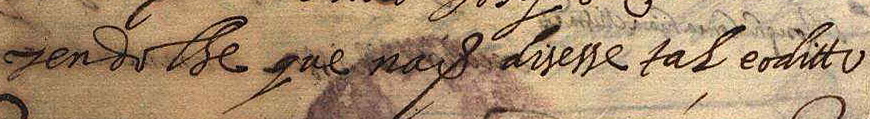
zendolhe que naõ disesse tal, e o ditto
